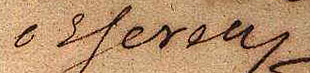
o Escreuj.
